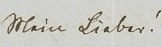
Mein Lieber!
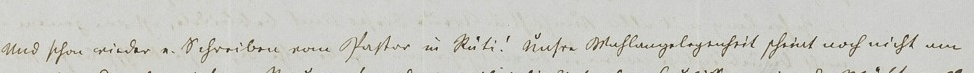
Und schon wieder e. Schreiben vom Pastor in Rüti! Unsre Wahlangelegenheit scheint noch nicht am
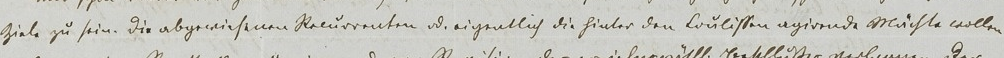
Ziele zu sein. Die abgewiesenen Recurrenten od. eigentlich die hinter den Coulissen agirende Mächte wollen
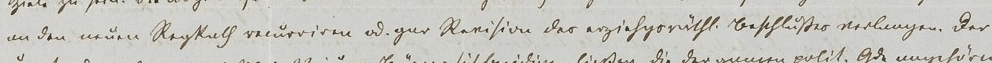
an den neuen RegRath recurriren od. gar Revision des erziehgsräthl. Beschlußes verlangen. Der
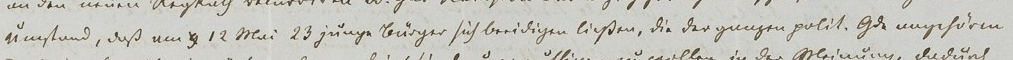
Umstand, daß am 12 Mai 23 junge Bürger sich beeidigen ließen, die der ganzen polit. Gde angehören
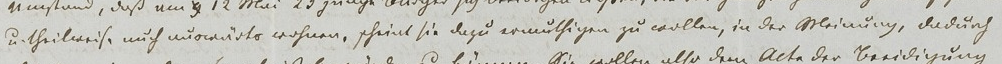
u. theilweise auch auswärts wohnen, scheint sie dazu ermuthigen zu wollen, in der Meinung, dadurch
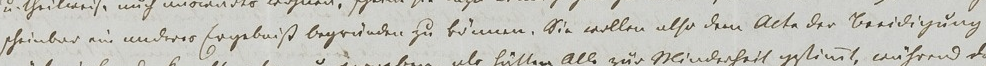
scheinbar ein anderes Ergebniß begründen zu können. Sie wollen also dem Acte der Beeidigung
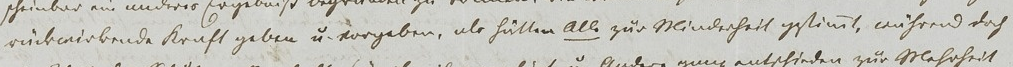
rückwirkende Kraft geben u. vorgeben, als hätten Alle zur Minderheit gestimmt, während doch
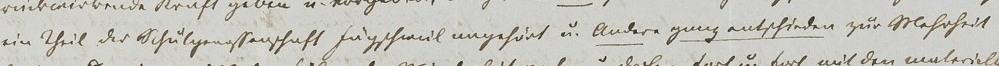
ein Theil der Schulgenossenschaft Fägschweil angehört u. Andere ganz entschieden zur Mehrheit
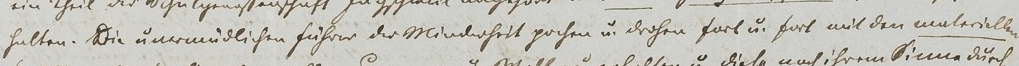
halten. Die unermüdlichen Führer der Minderheit pochen u. drohen fort u. fort mit den materiellen
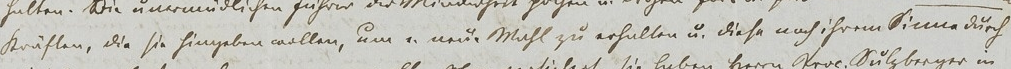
Kräften, die sie hingeben wollen, um e. neue Wahl zu erhalten u. diese nach ihrem Sinne durch
